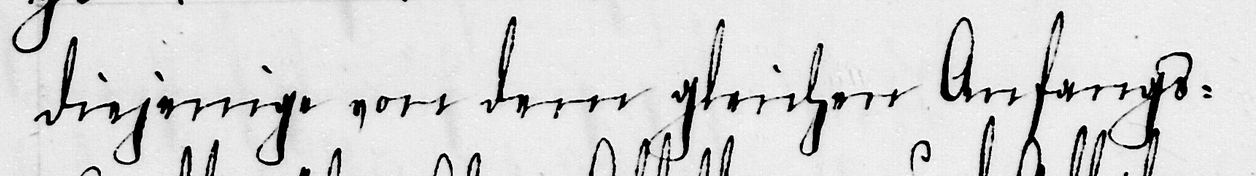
diejenige von dem gleichen Anfangs¬
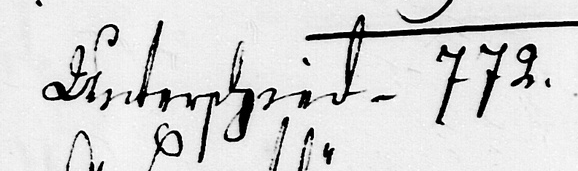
Unterschied – 772.
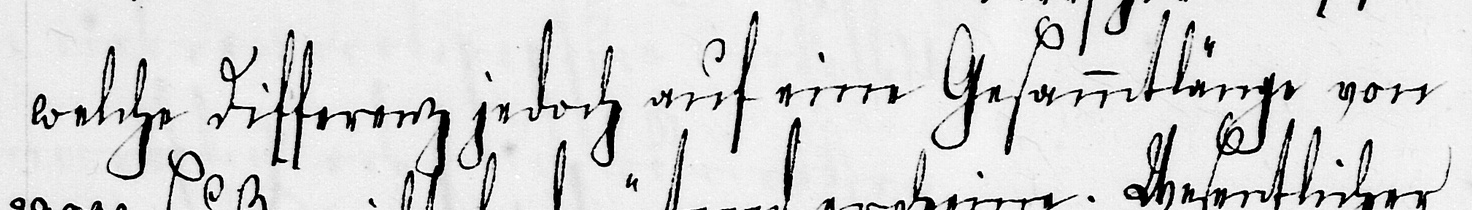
welche Differenz jedoch auf eine Gesammtlänge von
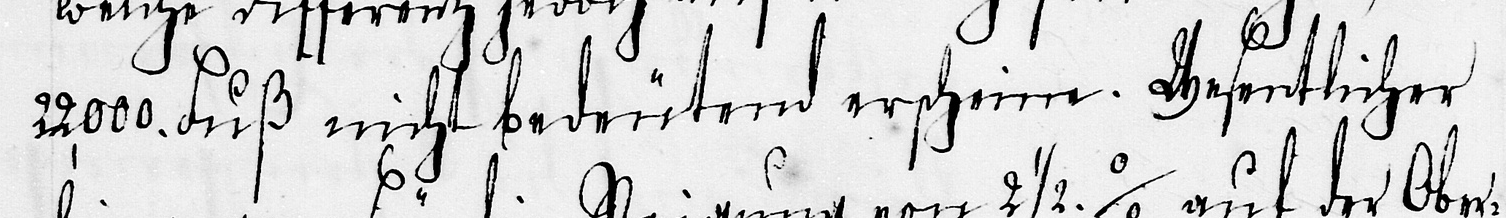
000. Fuß nicht bedeutend erscheine. Wesentlicher
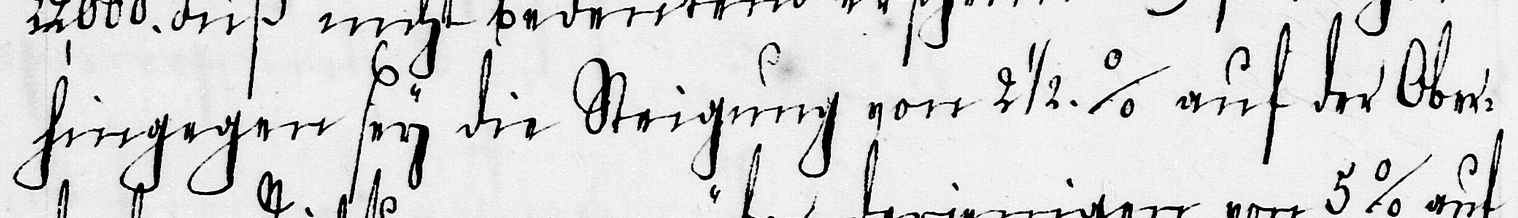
hingegen sey die Steigung von 2 ½.% auf der Ober¬
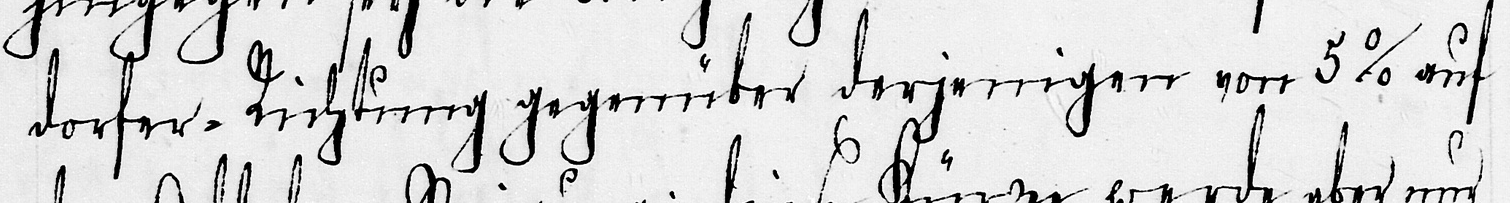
dorfer-Richtung gegenüber derjenigen von 5% auf
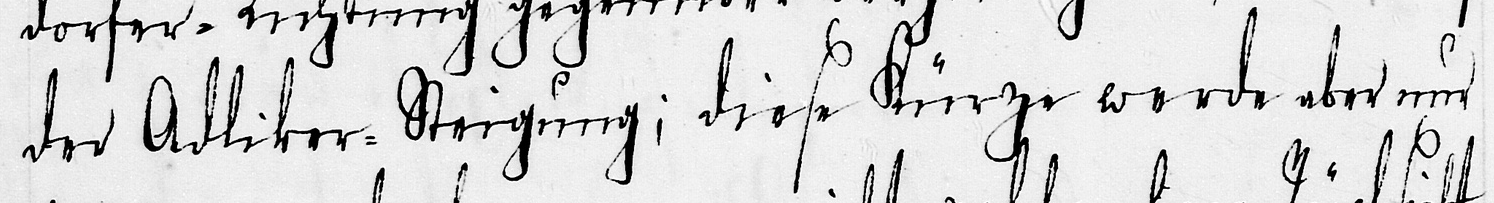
der Adliker-Steigung; diese Kürze werde aber nur
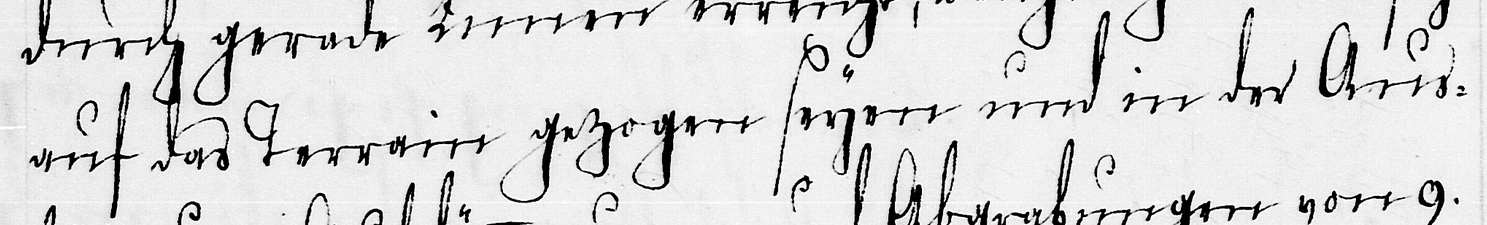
auf das Terrain gezogen seyen und in der Aus¬
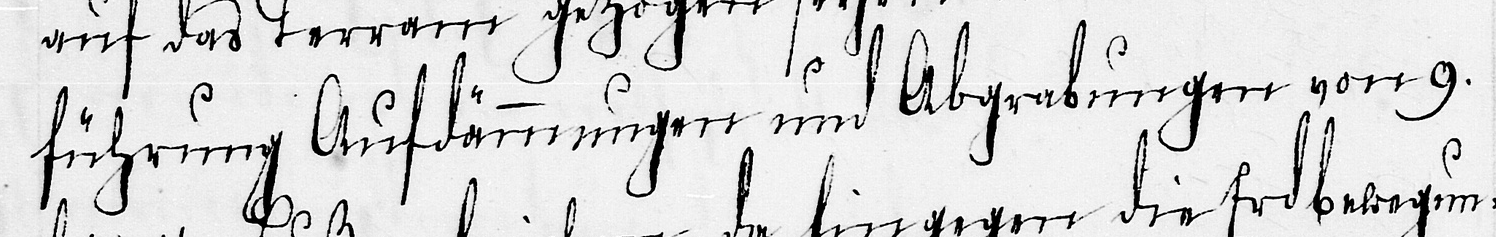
führung Aufdämmungen und Abgrabungen von 9.
